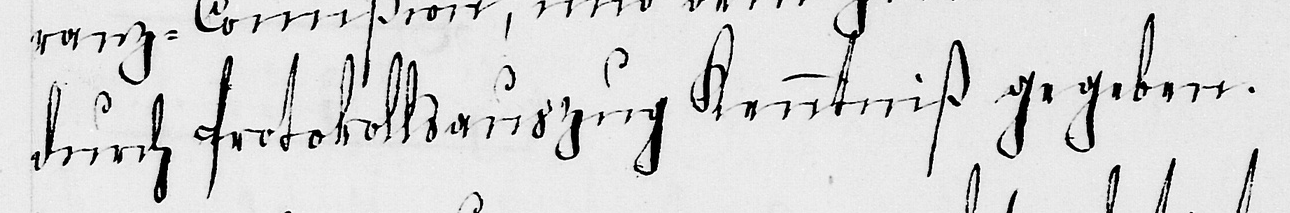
durch Protokollsauszug Kenntniß gegeben.
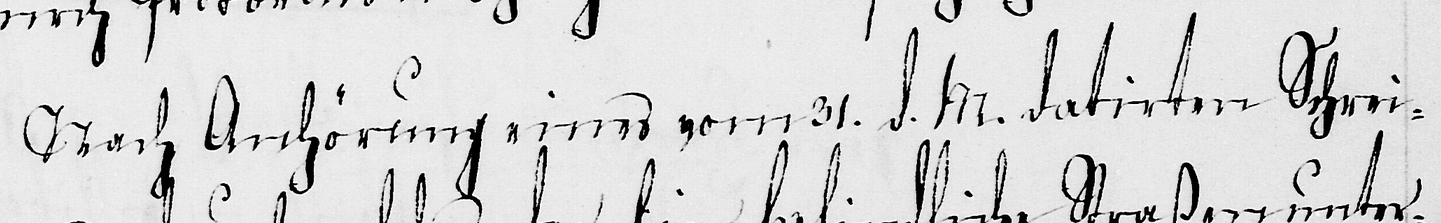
Nach Anhörung eines vom 31. d. M. datirten Schrei¬
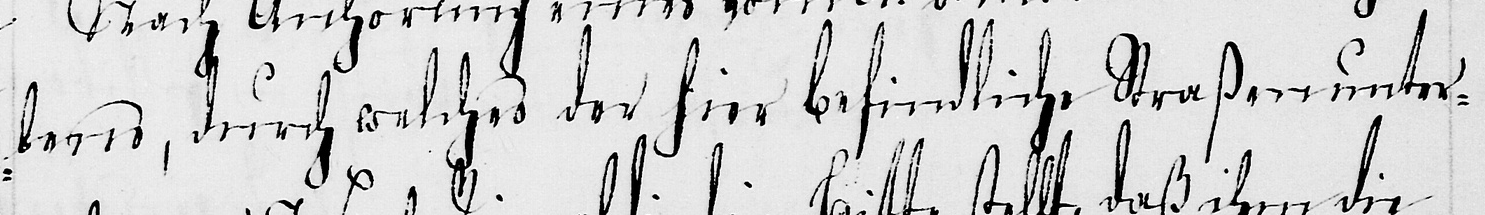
bens, durch welches der hier befindliche Straßenunter¬
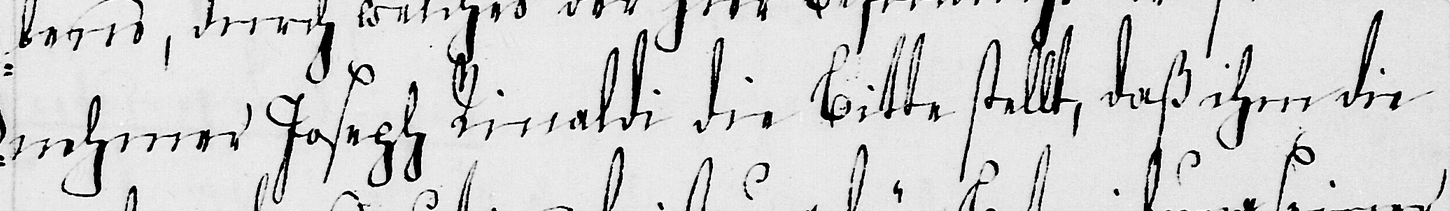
nehmer Joseph Rinaldi die Bitte stellt, daß ihm die
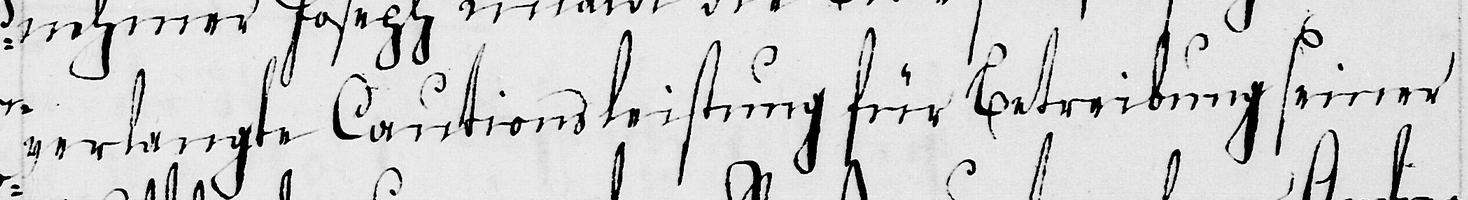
verlangte Cautionsleistung für Betreibung seiner
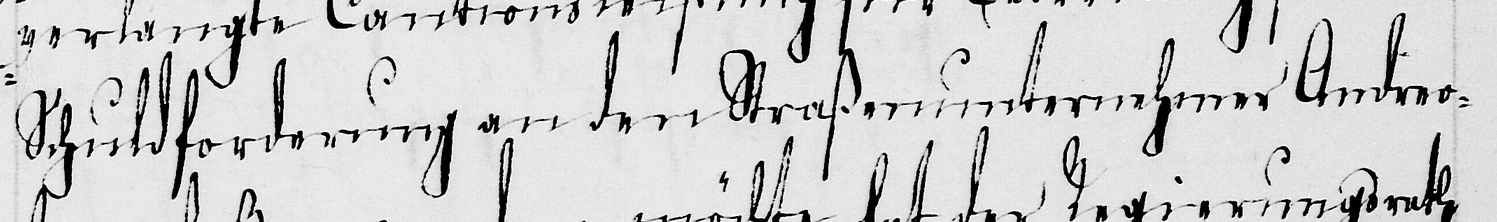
Schuldforderung an den Straßenunternehmer Andreo¬
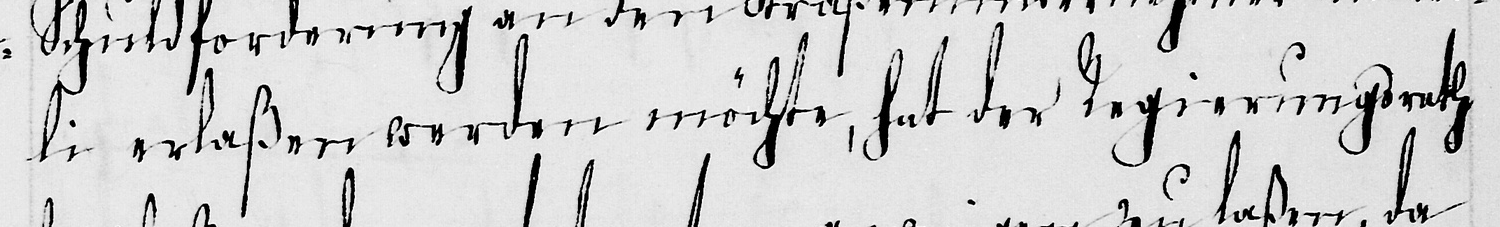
li erlaßen werden möchte, hat der Regierungsrath
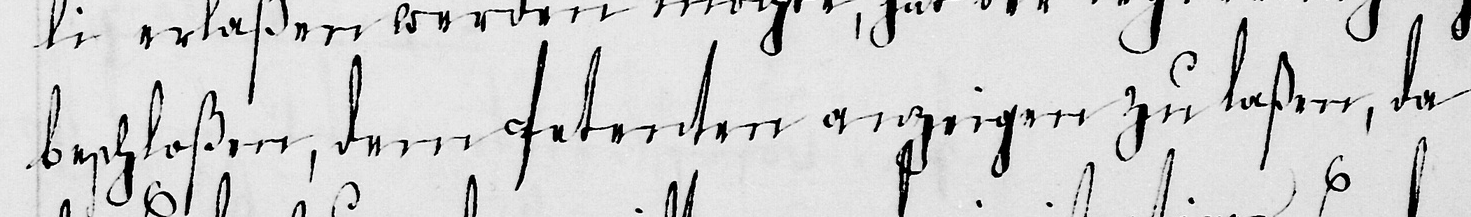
beschloßen, dem Petenten anzeigen zu laßen, da
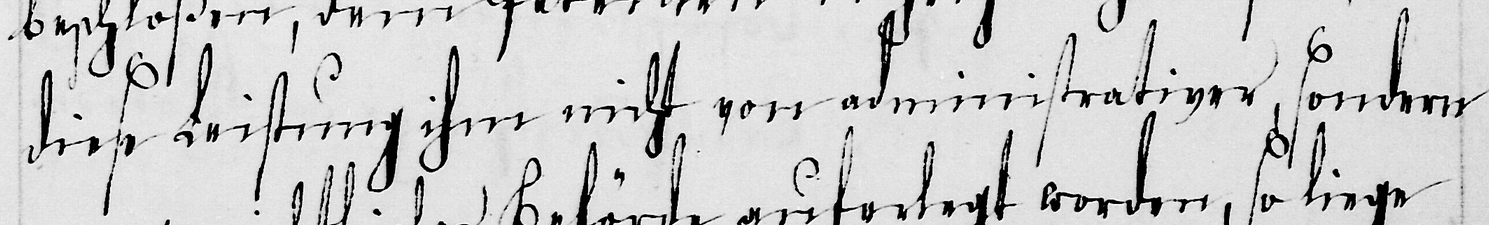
diese Leistung ihm nicht von administrativer sondern
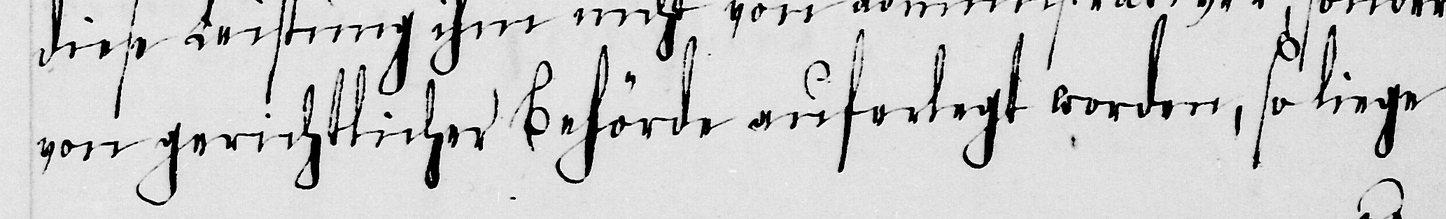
von gerichtlicher Behörde auferlegt worden, so liege
